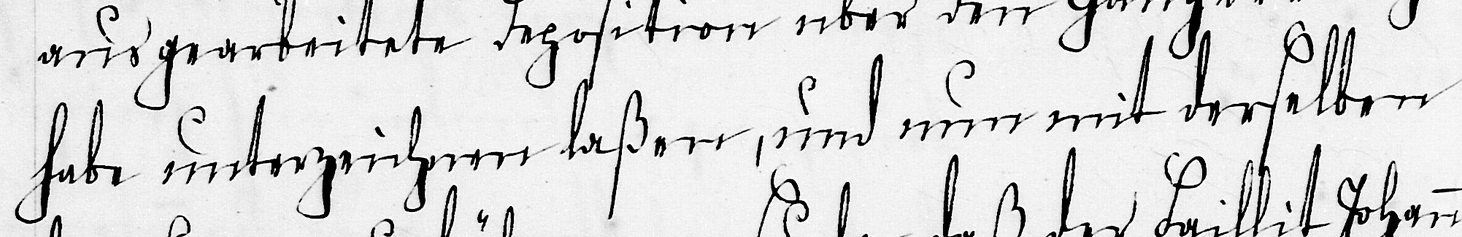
habe unterzeichnen laßen, und nun mit derselben
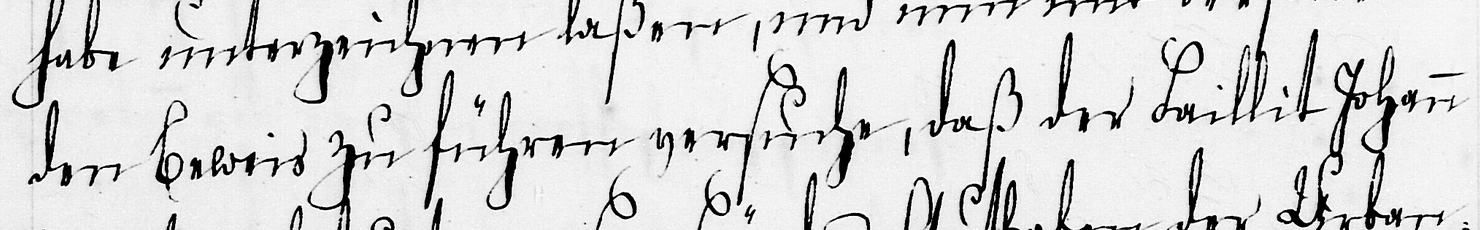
den Beweis zu führen versuche, daß der Faillit Johan¬
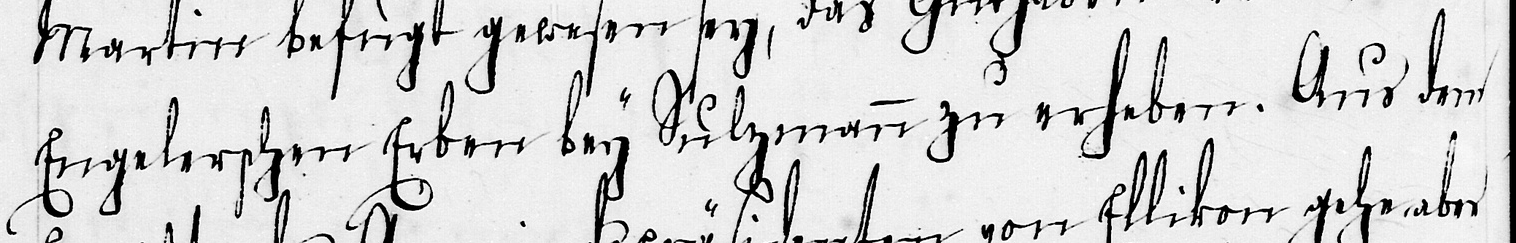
Engelerschen Erben bey Sulzmann zu erheben. Aus dem
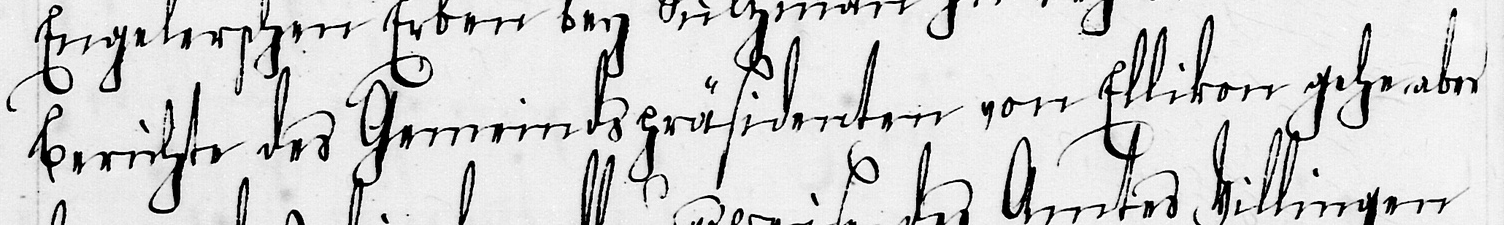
Berichte des Gemeindspräsidenten von Ellikon gehe aber
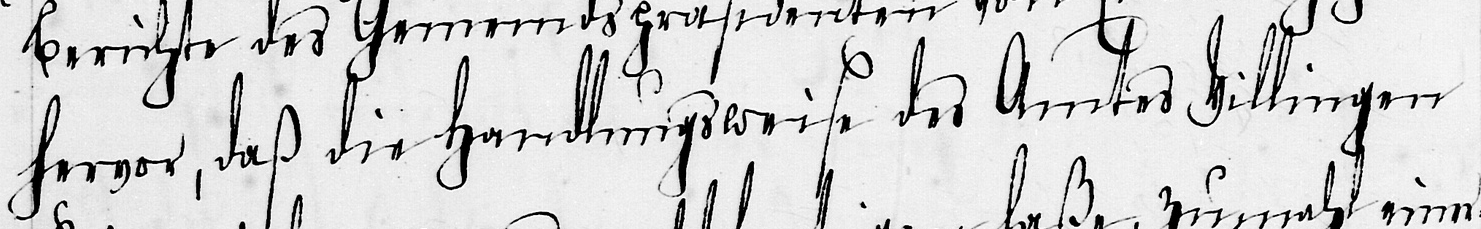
hervor, daß die Handlungsweise des Amtes Villingen
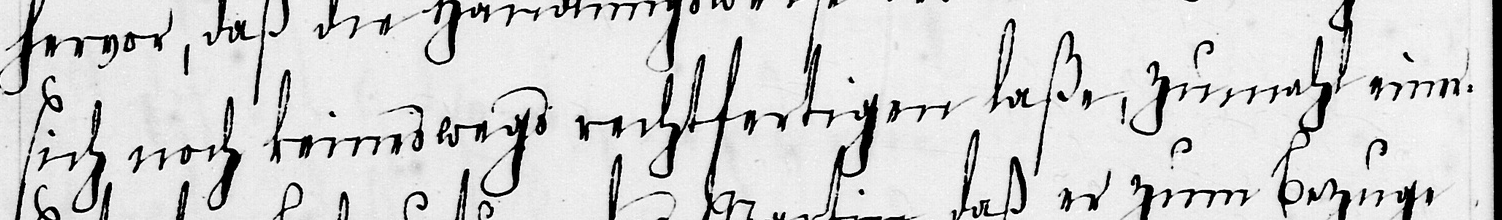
sich noch keineswegs rechtfertigen laße, zumahl einer¬
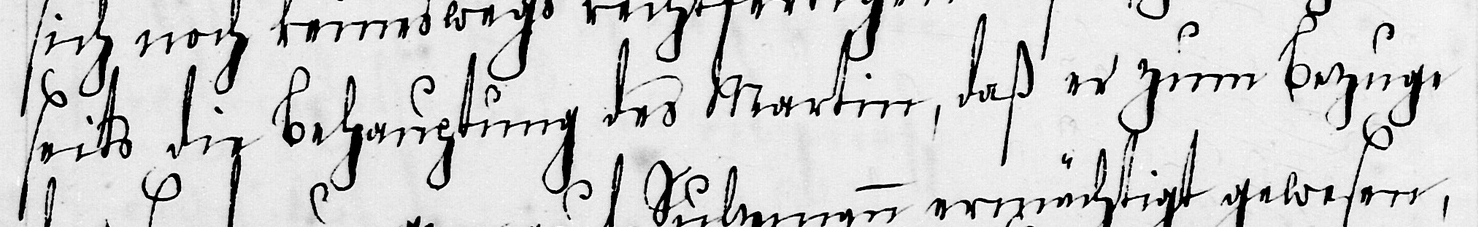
seits die Behauptung des Martin, daß er zum Bezuge
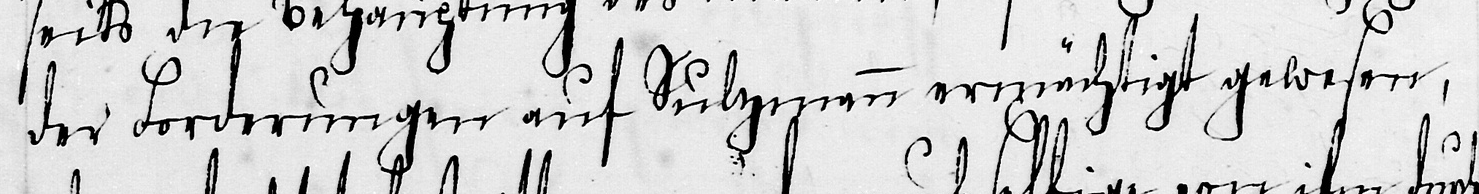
der Forderungen auf Sulzmann ermächtigt gewesen,
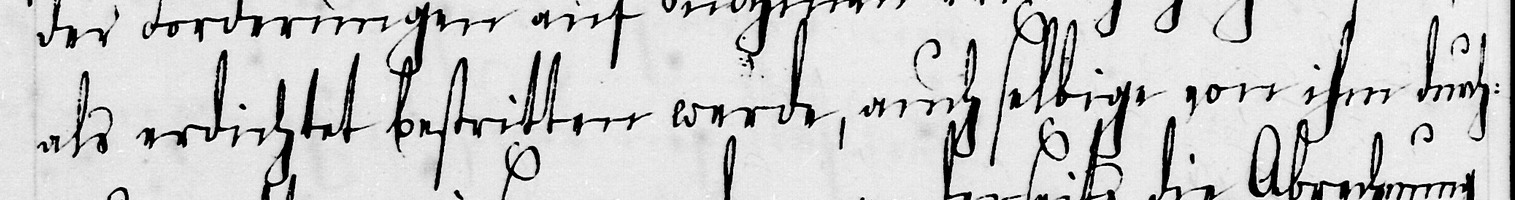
als erdichtet bestritten werde, auch selbige von ihm durc¬
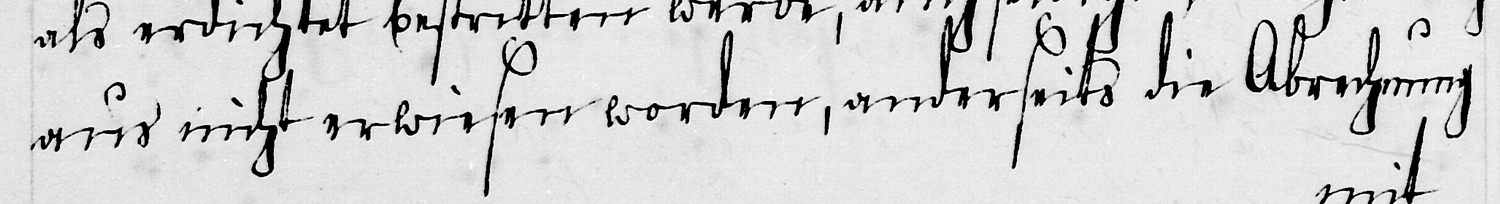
haus nicht erwiesen worden, anderseits die Abrechnung
